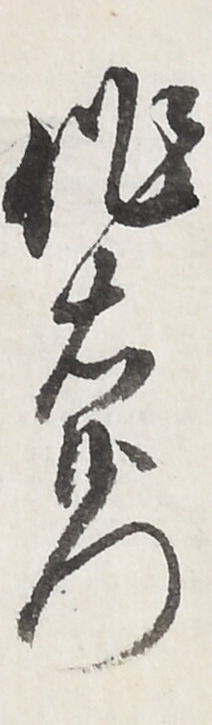新右衛門
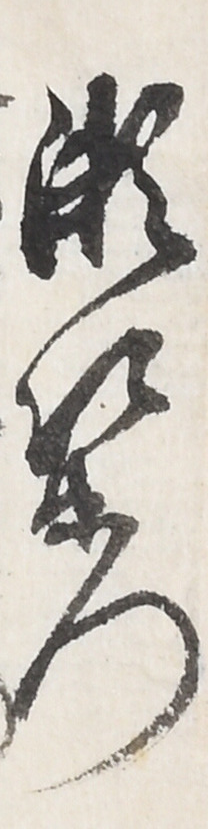久左衛門
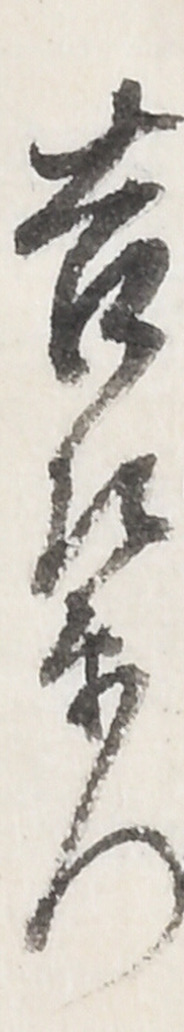吉左衛門
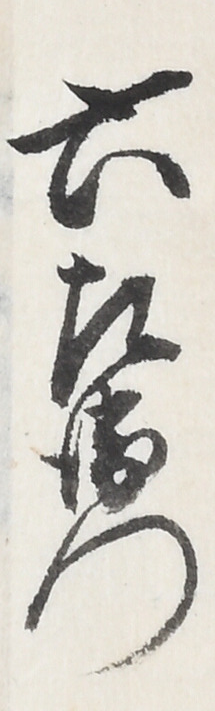久左衛門
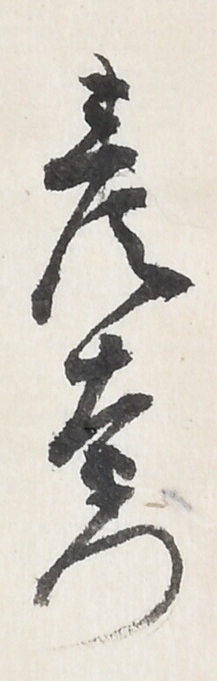新右衛門
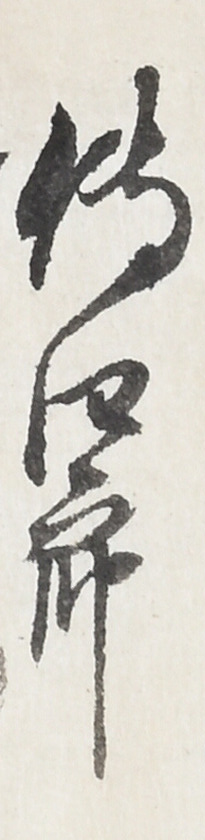伝四郎
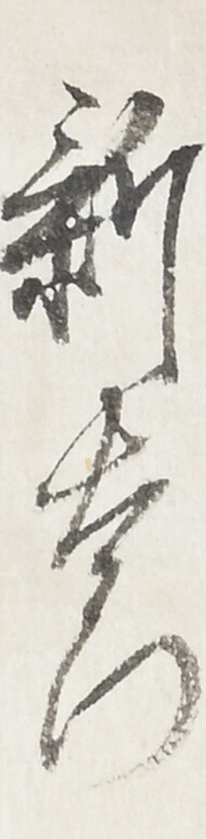新右衛門

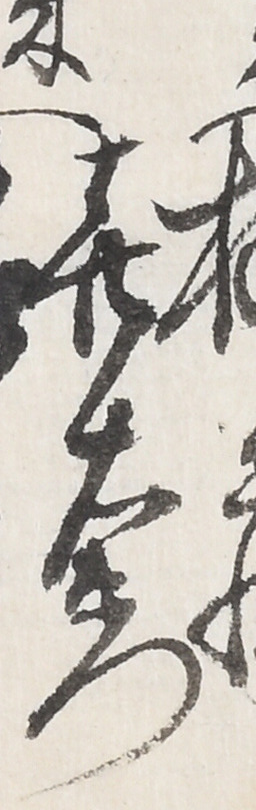五右衛門
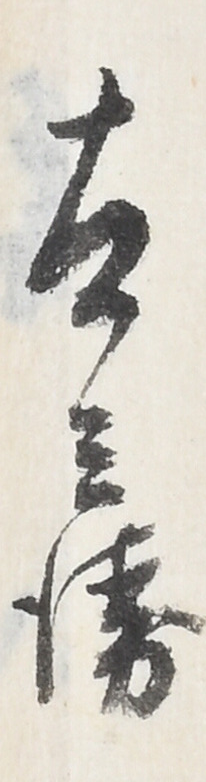太兵衛
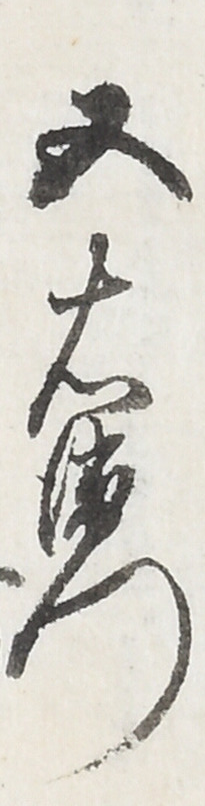五右衛門
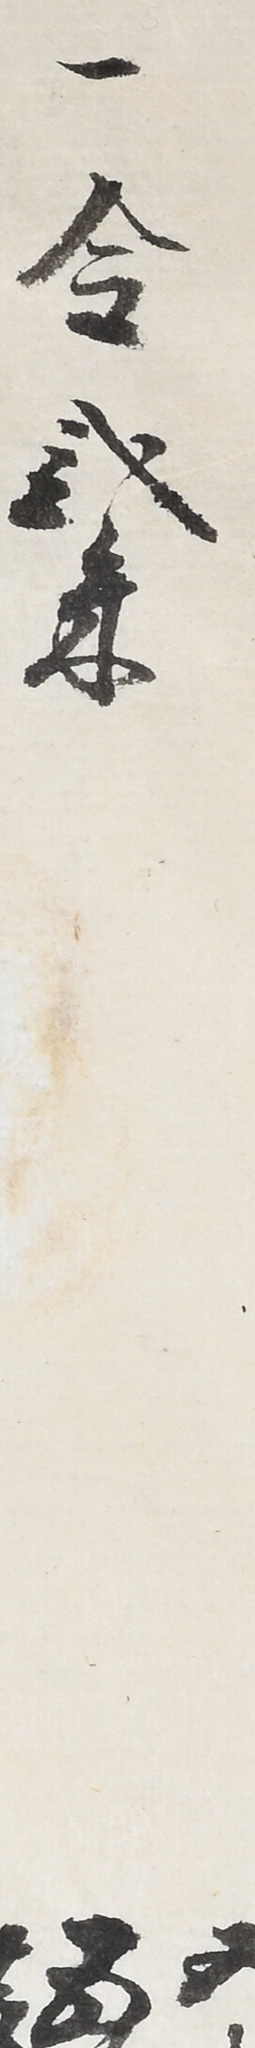一金弐朱五兵衛
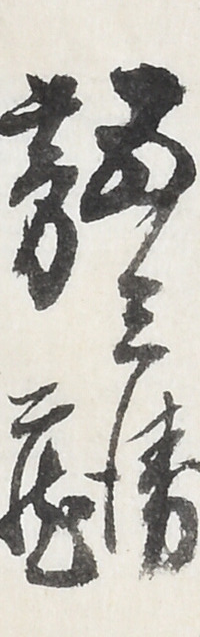太兵衛
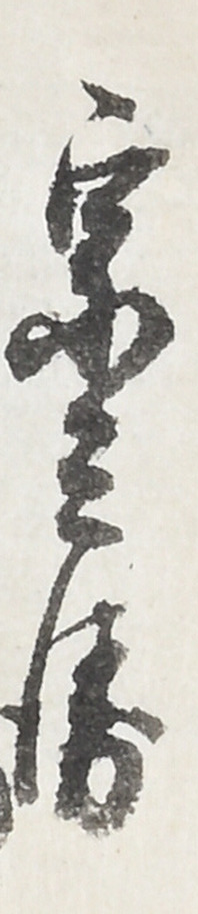宗兵衛
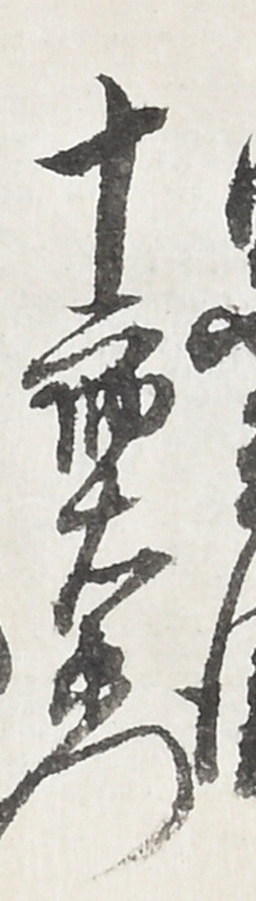十郎右衛門
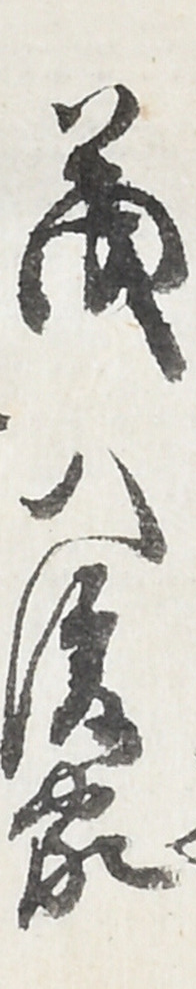茂八後家
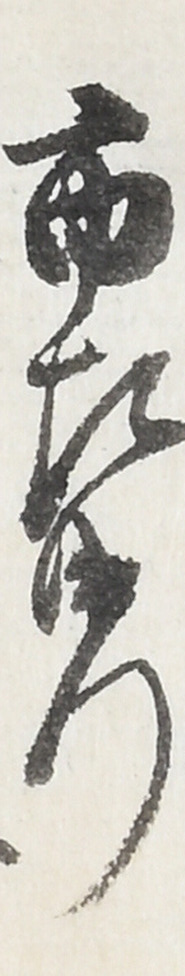市左衛門
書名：御拝地百五拾年御祝儀献上御目録名前
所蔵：伊那市立高遠町図書館・合同会社AMANE
